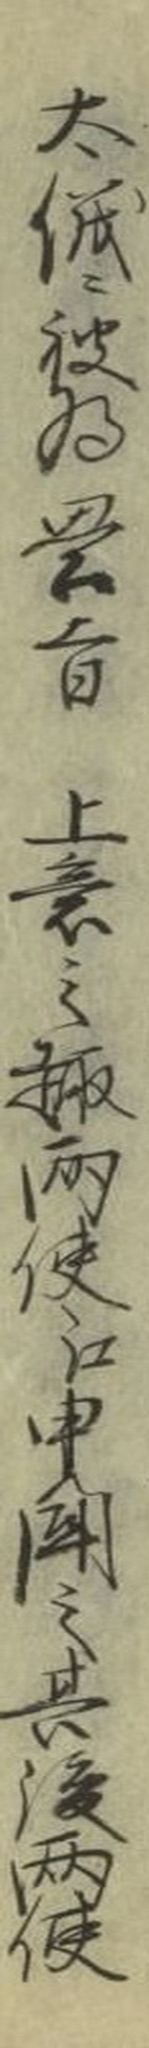太儀に被為思召旨上意之趣両使え申聞之其後両使
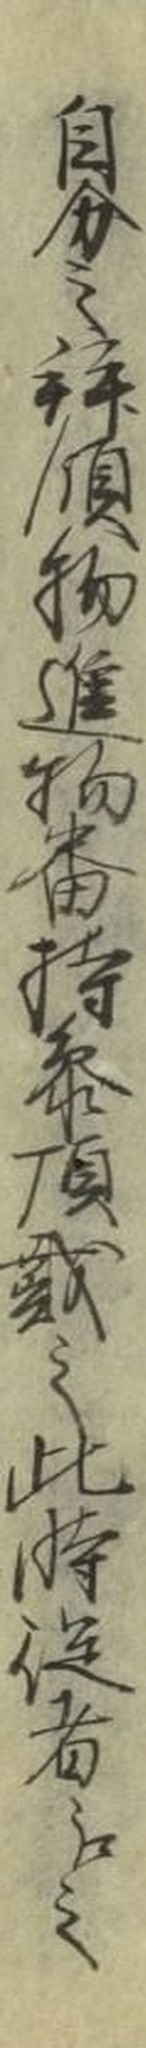自分之拝領物進物番持参頂戴之此時従者え之
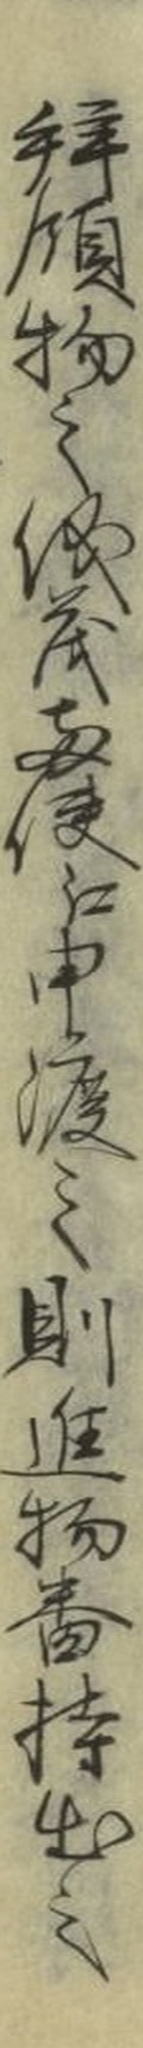拝領物之儀も両使え申渡之則進物番持出之
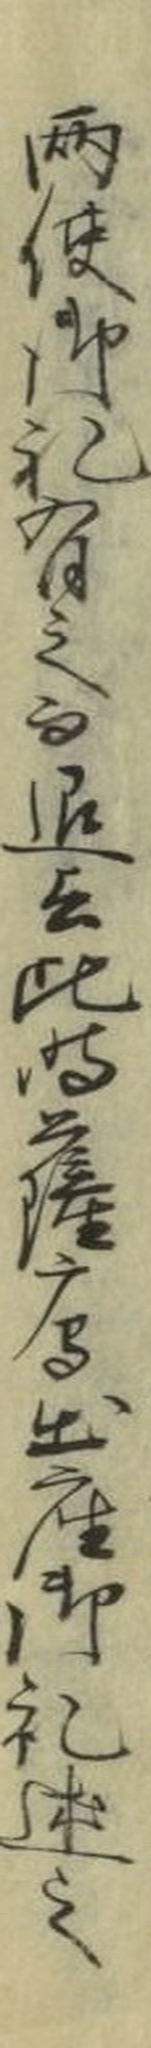両使御礼有之而退去此時薩摩守出座御礼述之
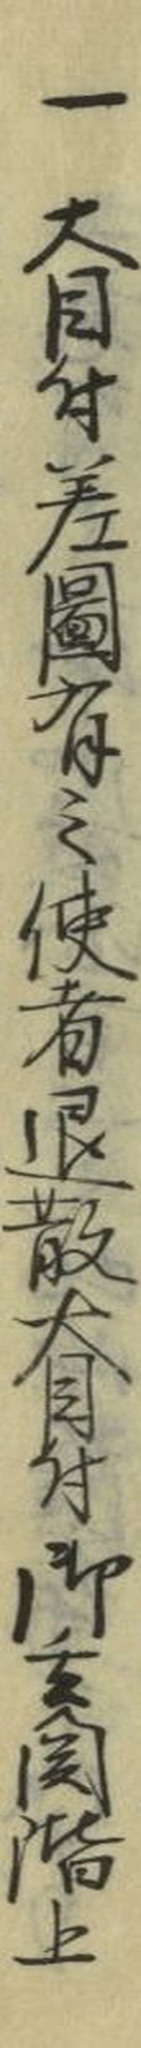一大目付差図有之使者退散大目付御玄関階上
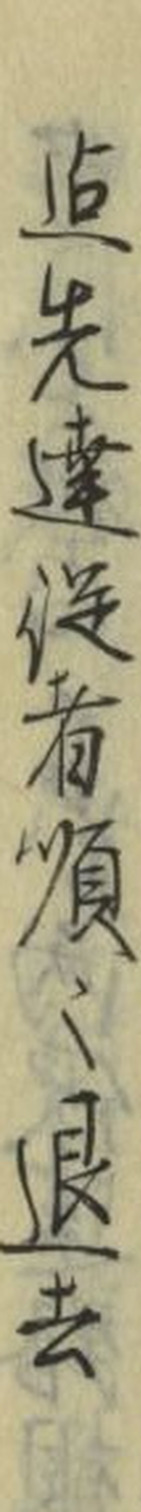迄先達従者順々退去
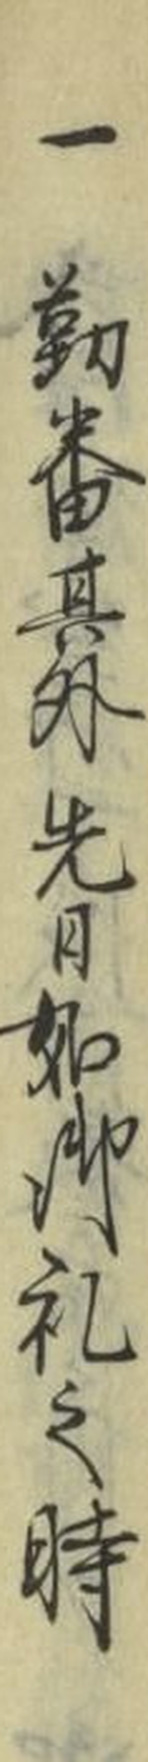一勤番其外先日如御礼之時
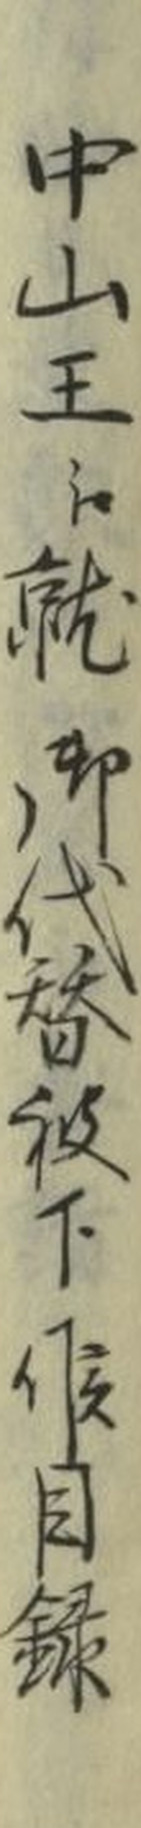中山王え就御代替被下候目録
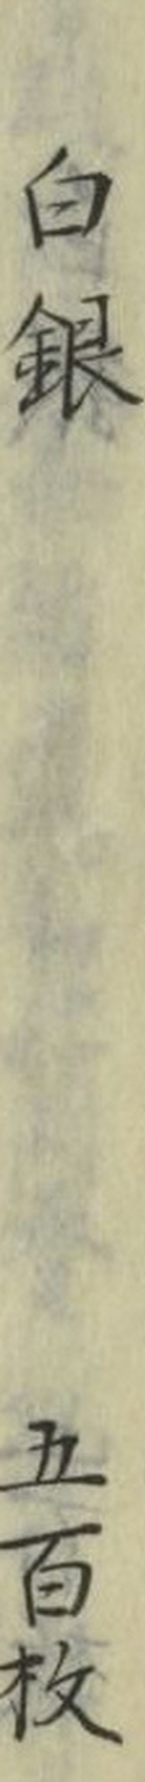白銀五百枚
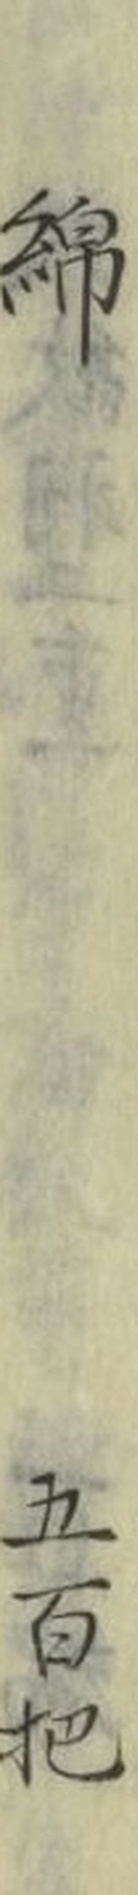綿五百把
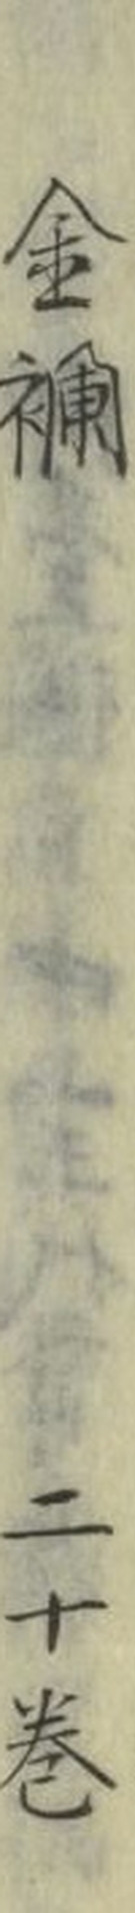金襽二十巻
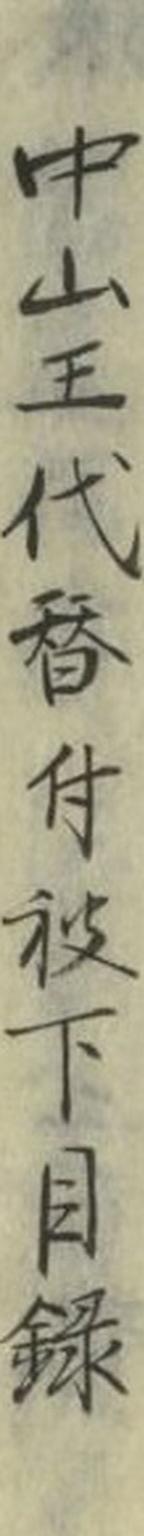中山王代替付被下目録
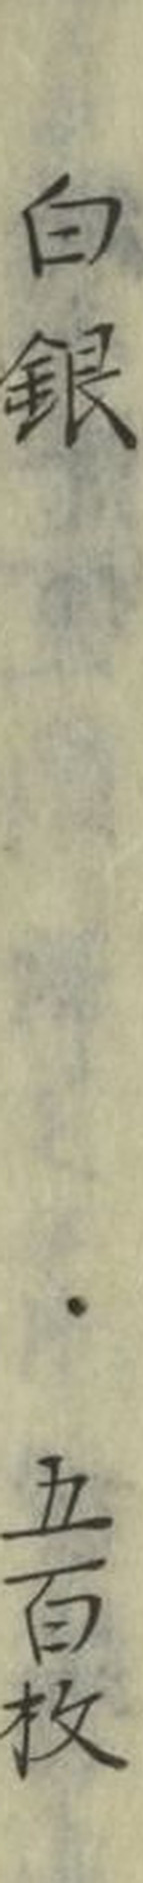白銀五百枚
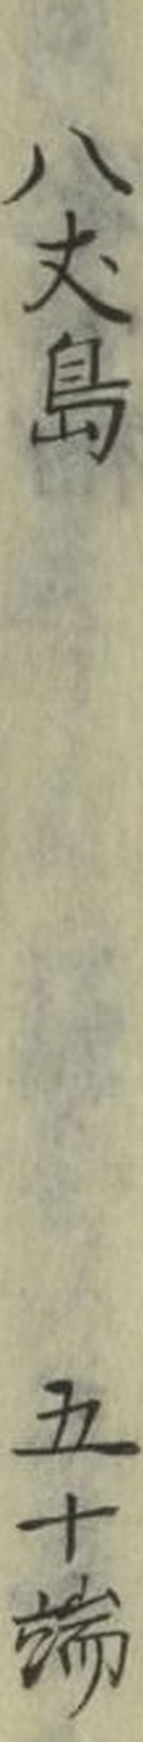八丈島五十端
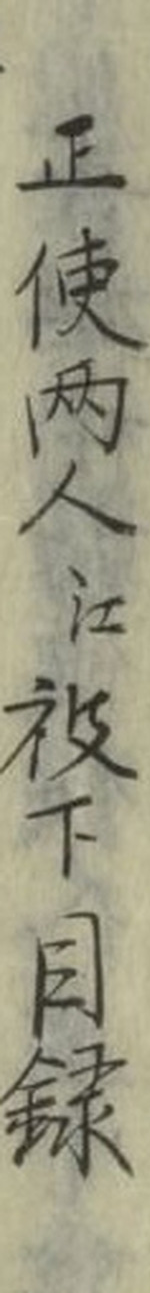正使両人え被下目録
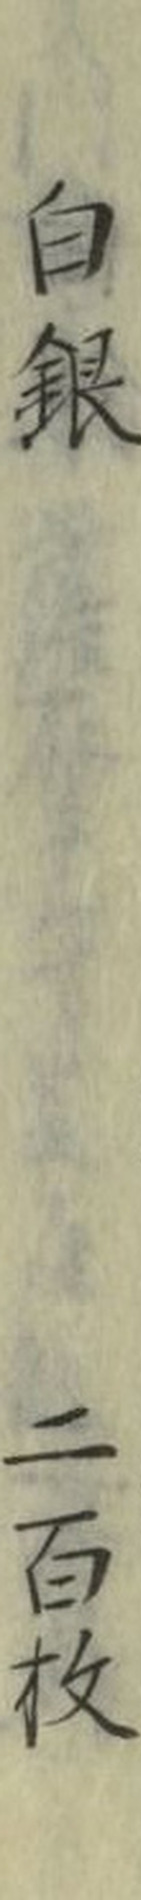白銀二百枚
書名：宝永七庚寅年琉球国来聘使日記
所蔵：University of the Ryukyus Library
